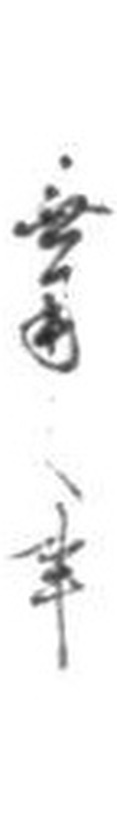無用之事
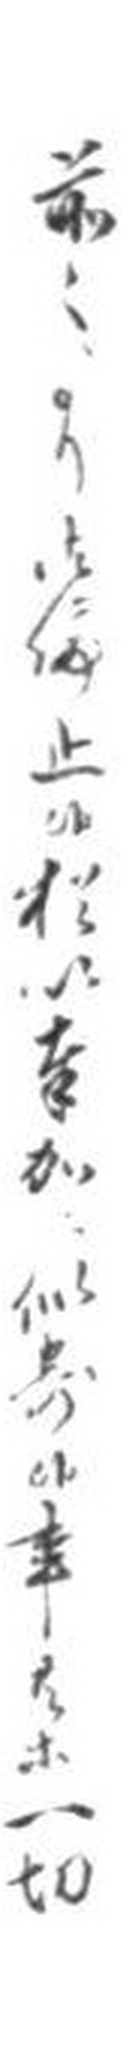前々より御停止候猶以奉加ニ似寄候事共等一切
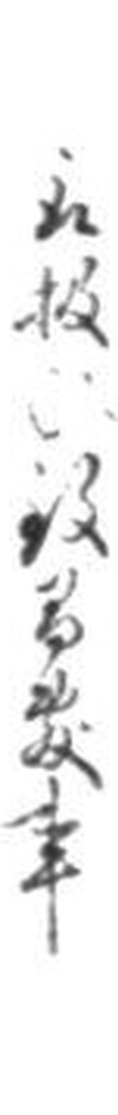取扱ひ致間敷事
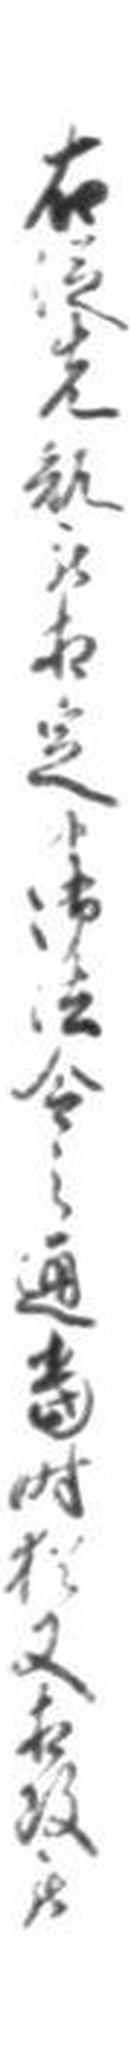右従先規被相定候御法令之通当時猶又相改被
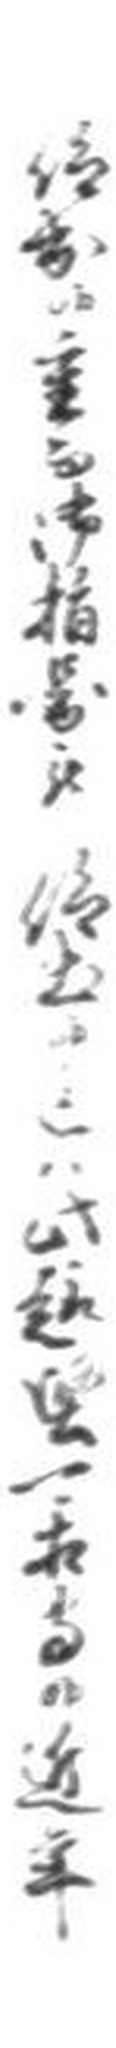仰出候重而御指図被仰出候迄ハ此趣堅可相守候近年
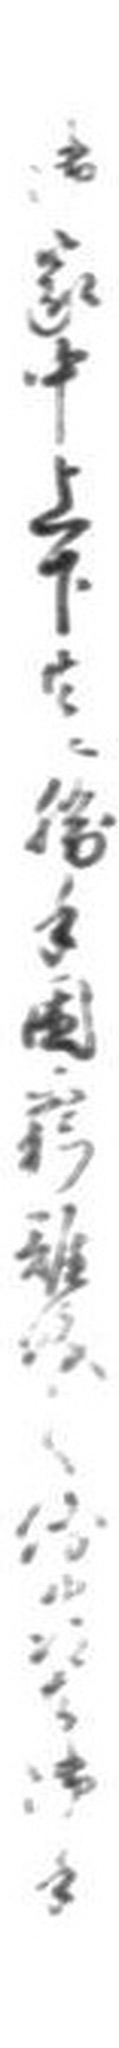御家中上下共ニ勝手困窮難儀之儀候得共御手
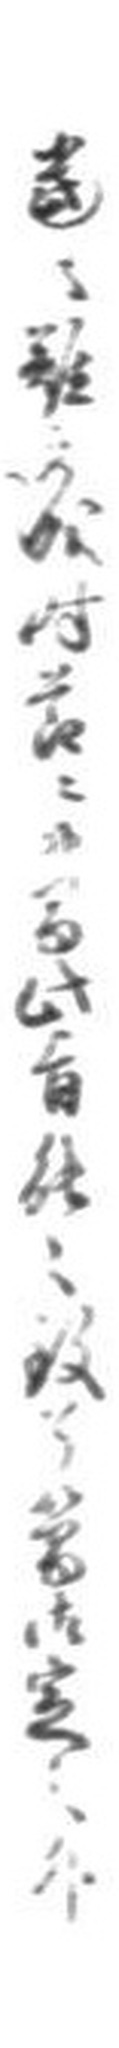当も難被成時節ニ候間此旨能々致了簡御定之外
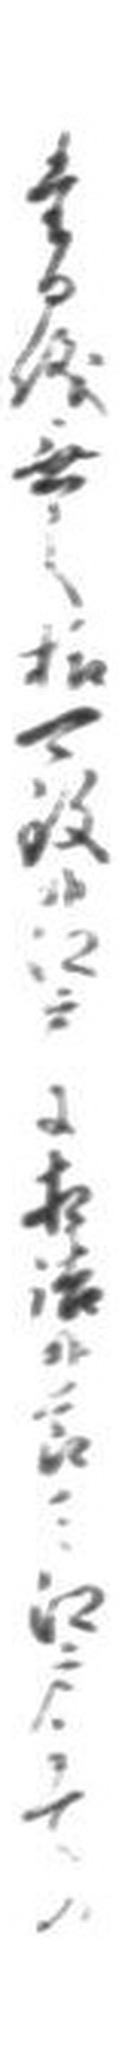たる儀無之様可致候江戸に相詰候節者江戸ニての
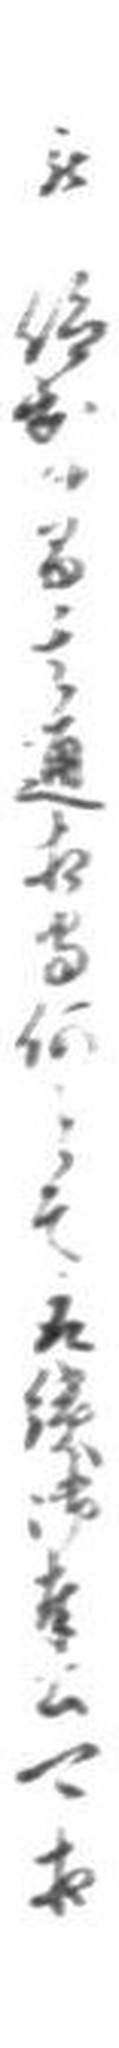被仰出候間其通相守何とそ取続御奉公可相
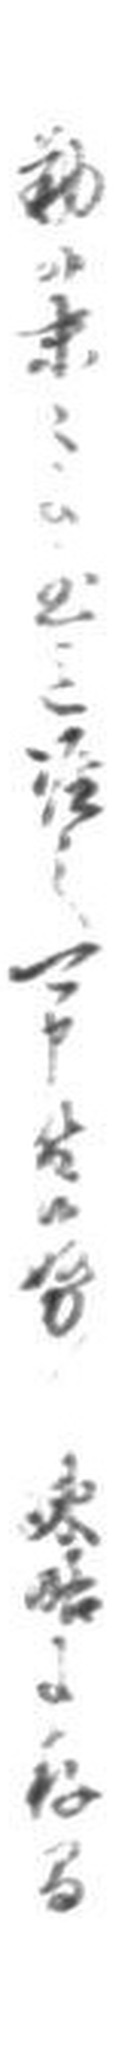勤候末々に至迄准之可申付候努〳〵疎略に存間
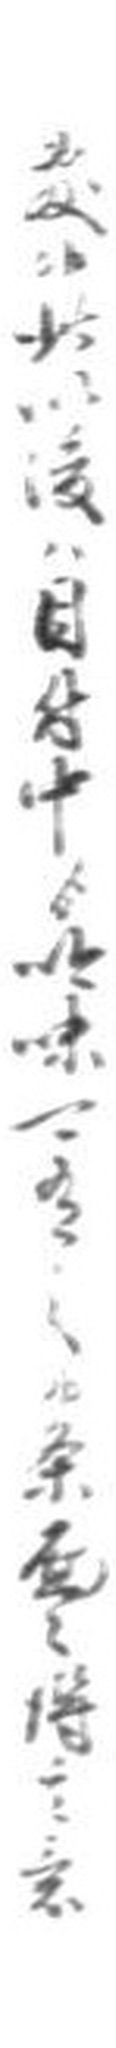敷候此以後ハ目付中ゟ吟味可有之候条面々得其意
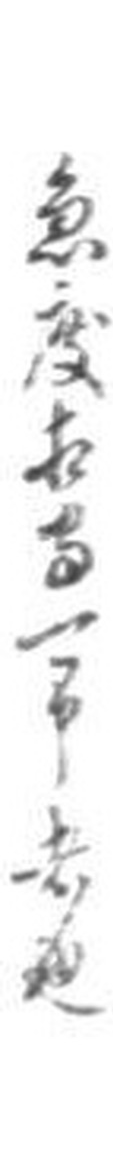急度相守可申者也
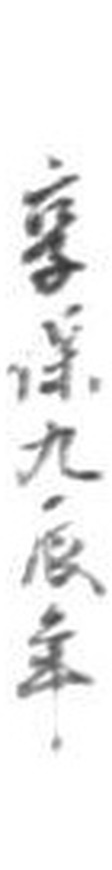享保九辰年

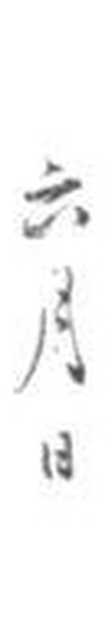六月日
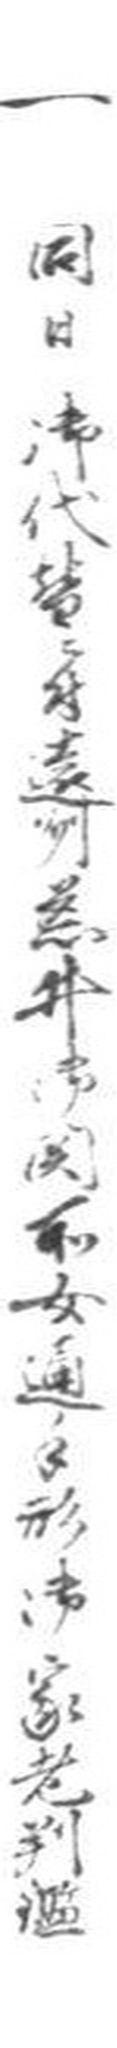一同日御代替ニ付遠州荒井御関所女通手形御家老判鑑
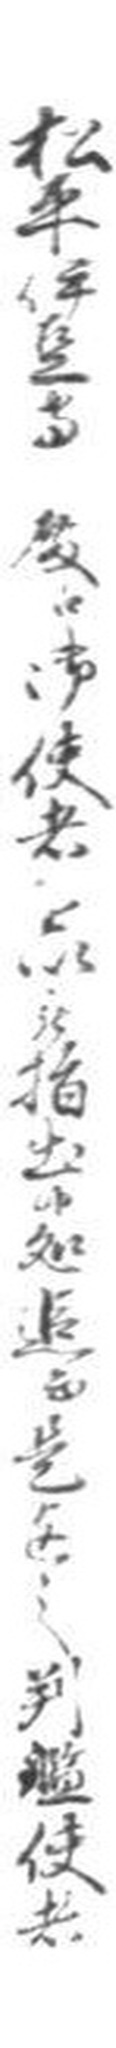松平伊豆守殿江御使者を以被指出候処追而是迄之判鑑使者
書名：家譜 三十八 宗矩公 従享保九年五月到享保九年十二月
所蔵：福井県文書館 Fukui Prefectural Archives
